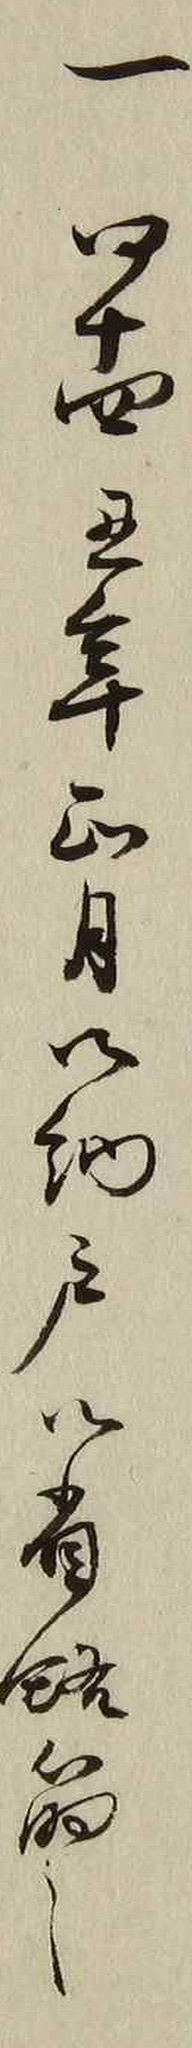一同十四丑年正月御納戸御省略筋之
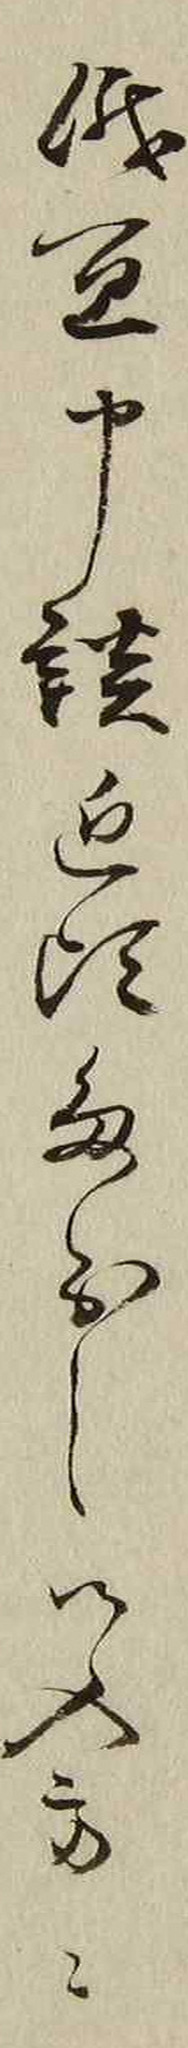儀宜申談近頃多分之御入方に
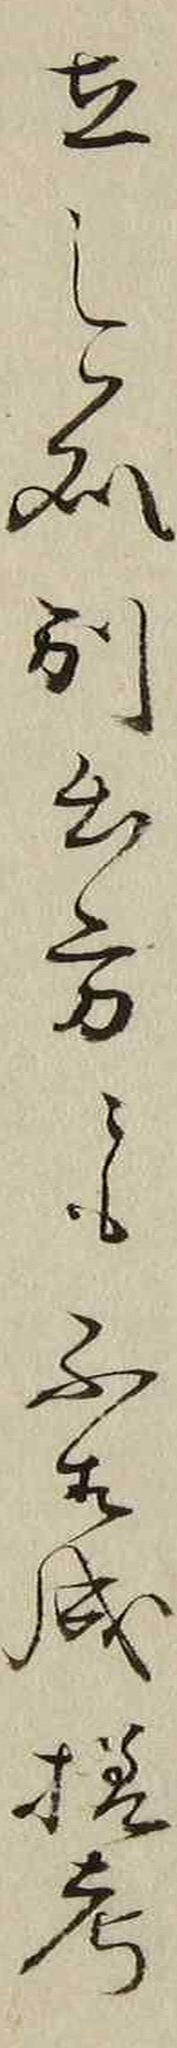在之候処別出方にも不相成様考
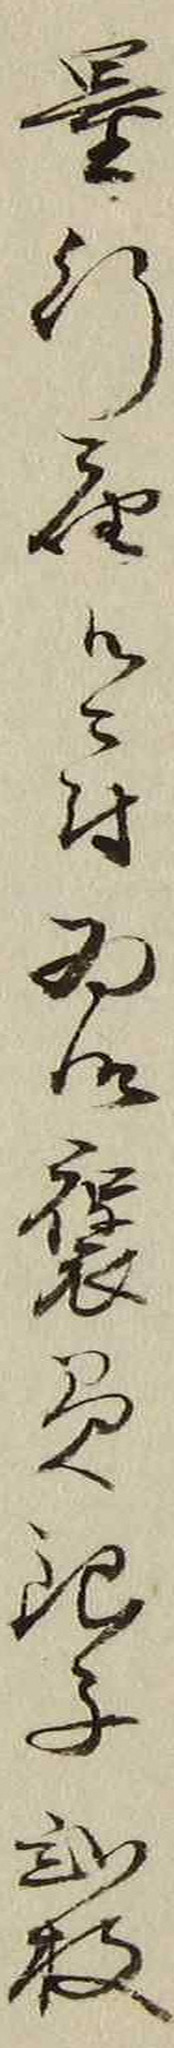量行届候に付為御褒美銀子弐枚
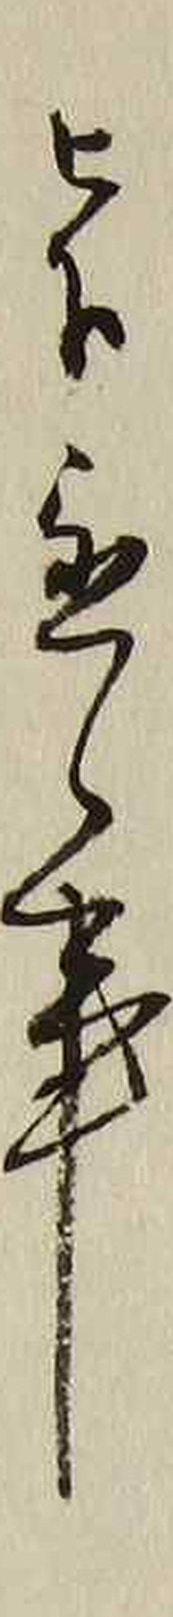被下置候事
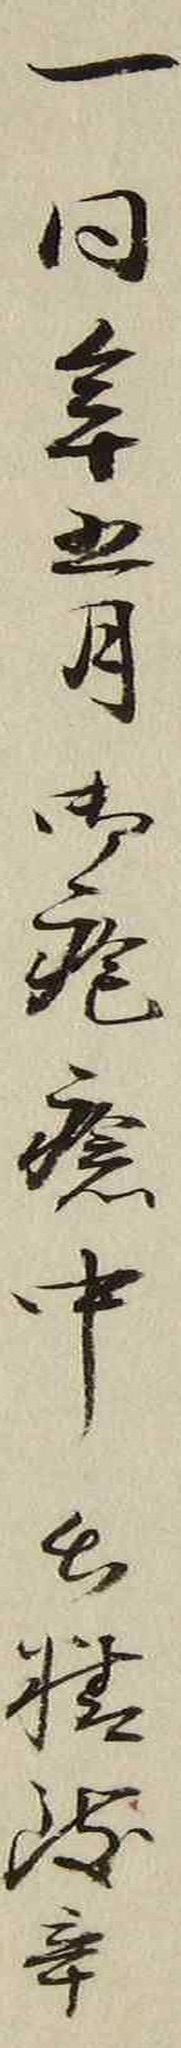一同年五月御疱瘡中出精致辛
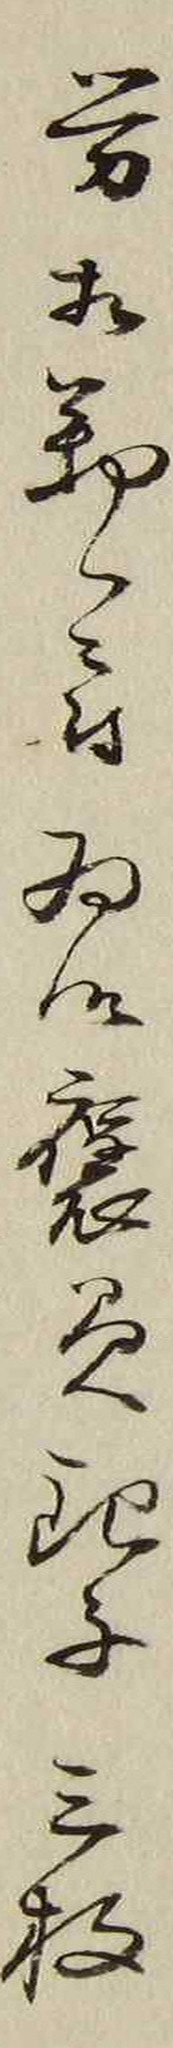労相勤候に付為御褒美銀子三枚
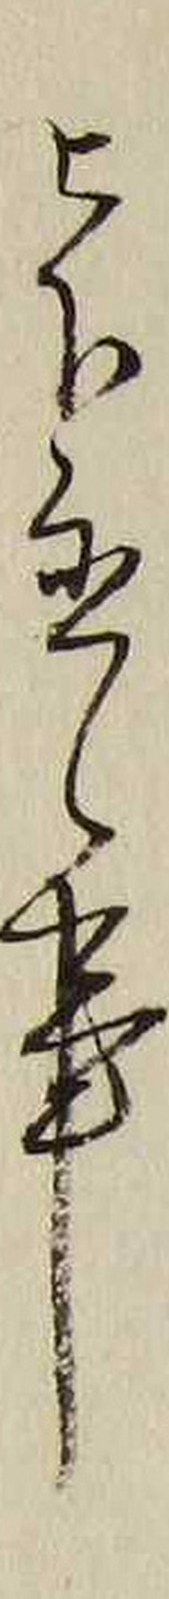被下置候事
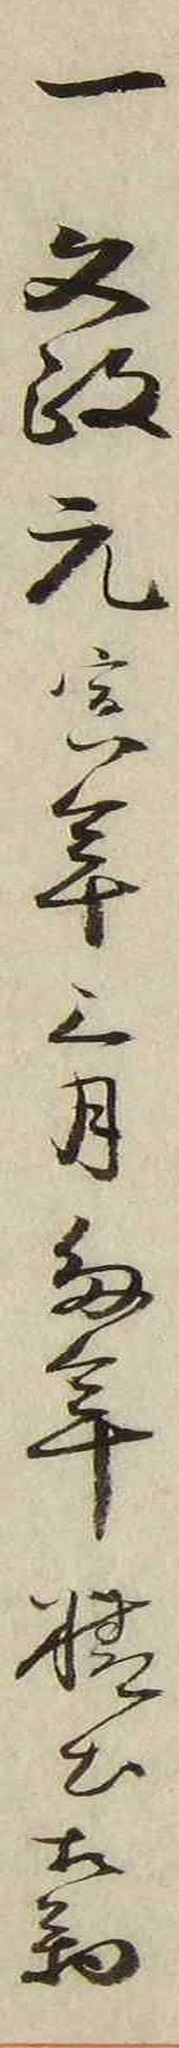一文政元寅年三月多年精出相勤

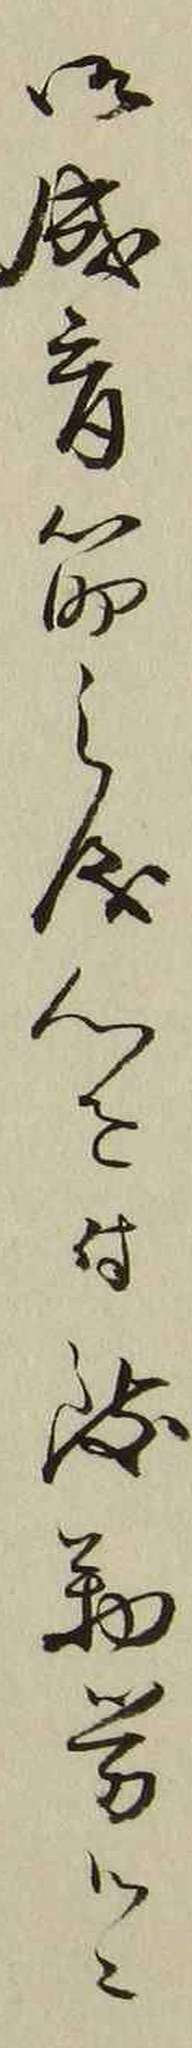御成育筋之儀心を付致勤労候に
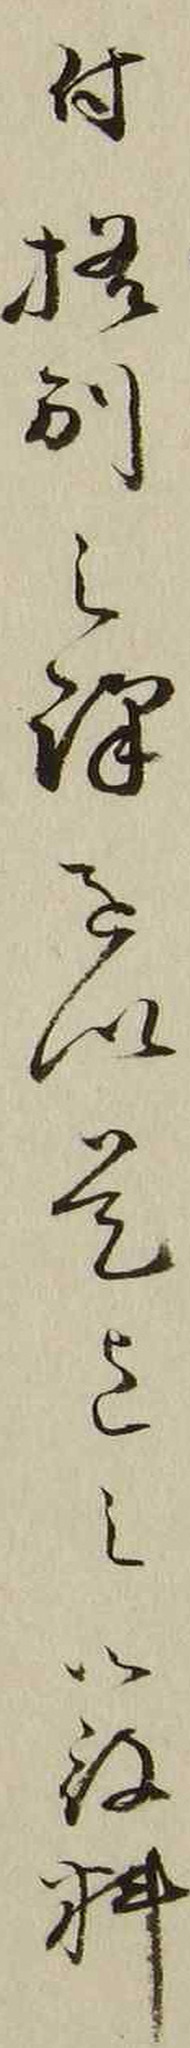付格別之譯を以是迄之御役料
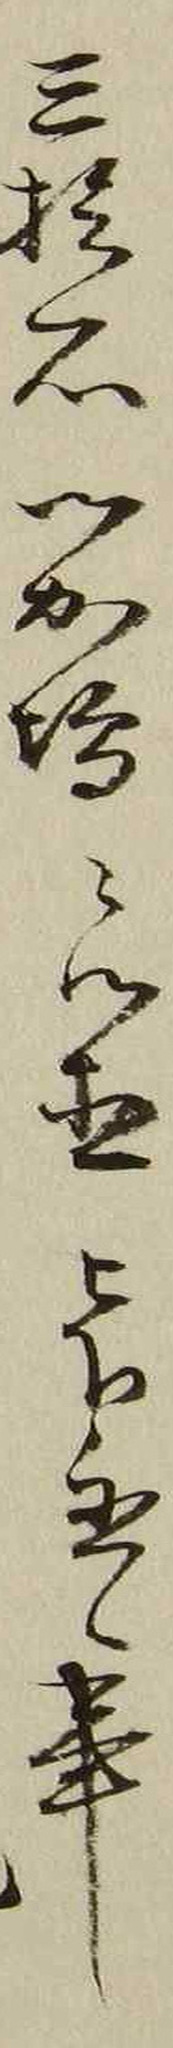三拾石御加増に御直被下置候事
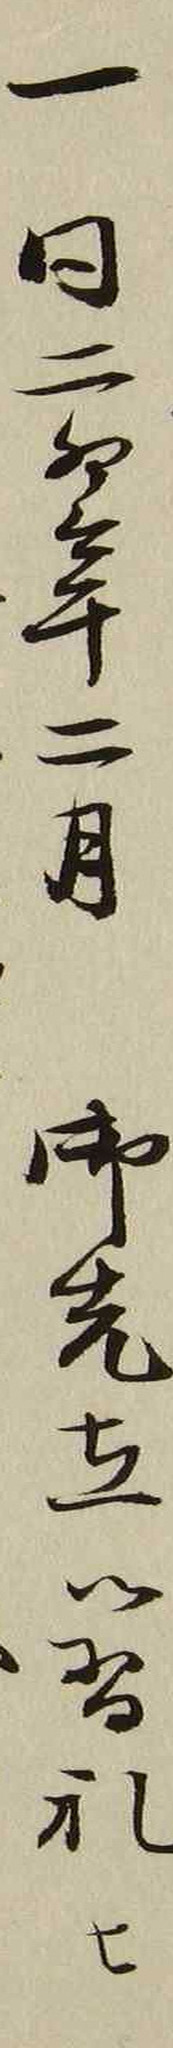一同二卯年二月御先立御習礼被
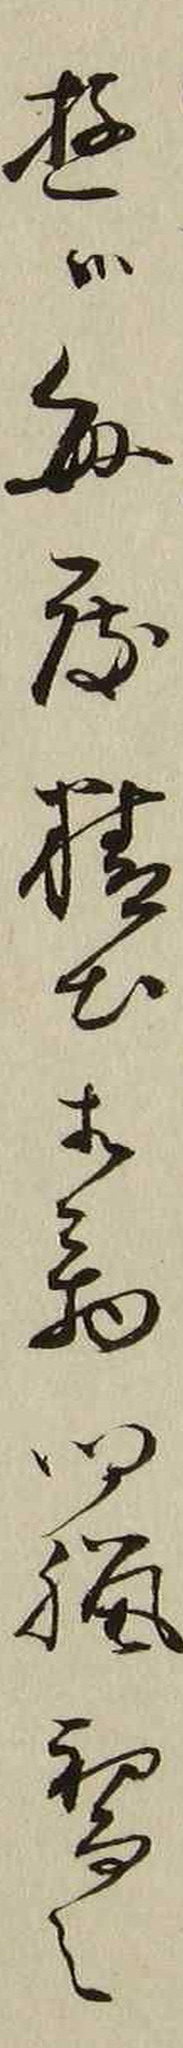遊候毎度精出相勤旧臘初而之
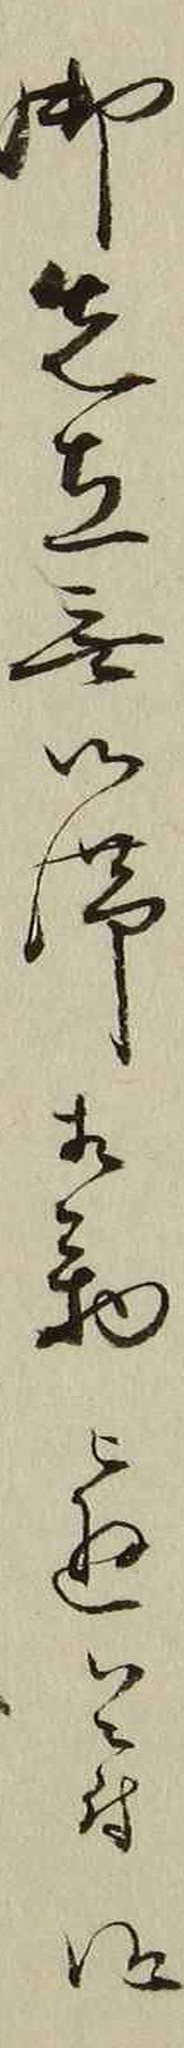御先立無御滞相勤被遊候に付御
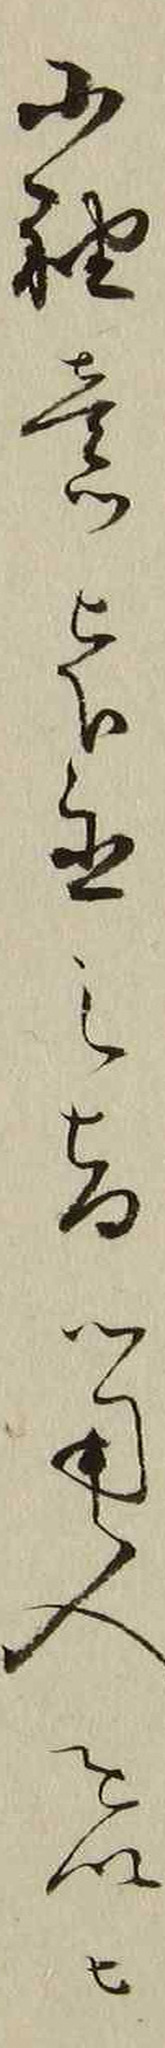小袖壱つ被下置之旨御用人を以被
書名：諸士系譜　巻之292　き之部1
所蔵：会津若松市立会津図書館
